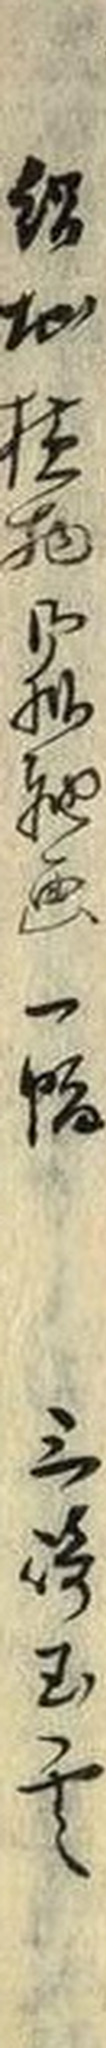絽地横物御掛軸画一幅三崎玉雲
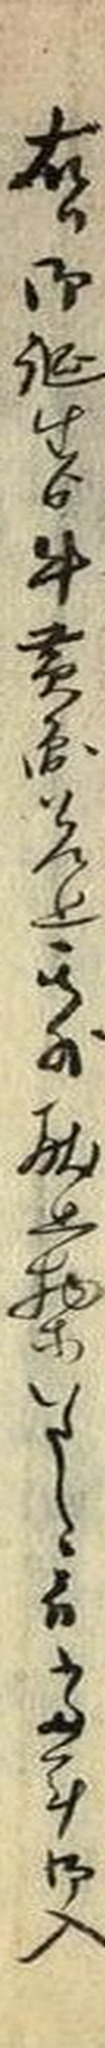右ハ御誕生ゟ牛黄円差上其外献上物等いたし候ニ付当年御入
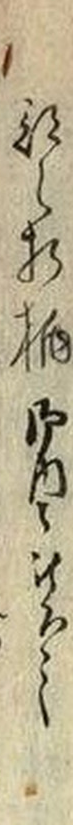部之折柄御内々被下之
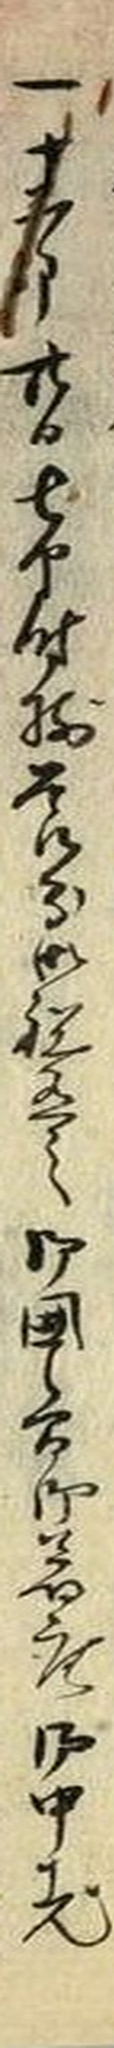一十二月廿日七半時揃節分御祝有之御囲之間御着座御中老
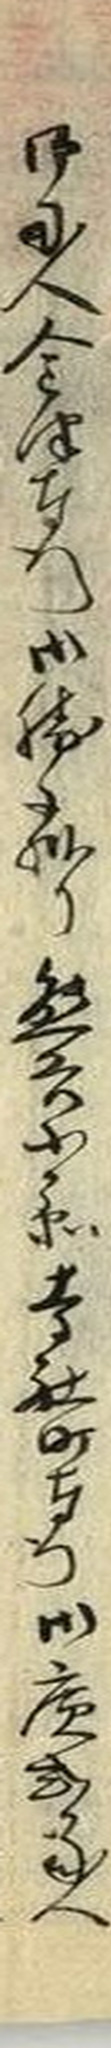御用人金津奉行御勝手掛り熊谷小兵衛寺社町奉行御広式御用人
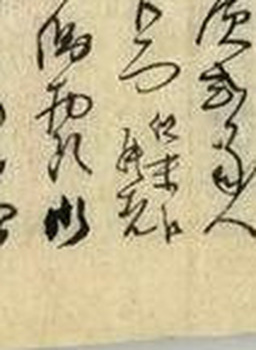罷出ル
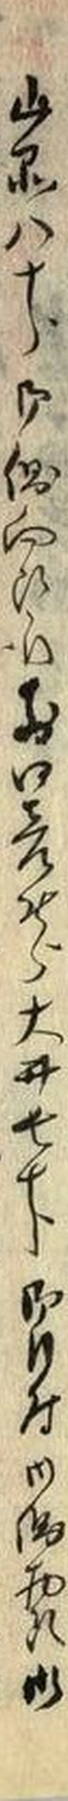山品八十郎御側向頭取前田彦次郎大井長十郎御目付御側物頭御
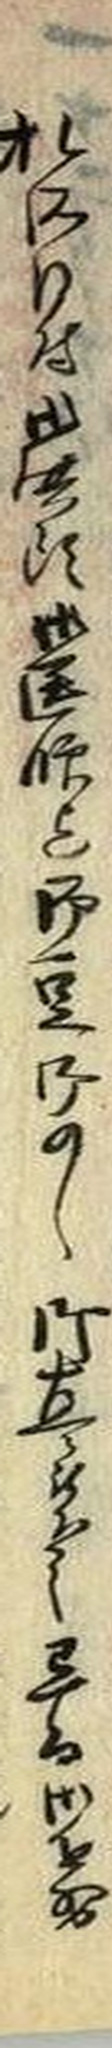札所目付御供頭御医師迄御豆御のし御直ニ被下之畢而御近習
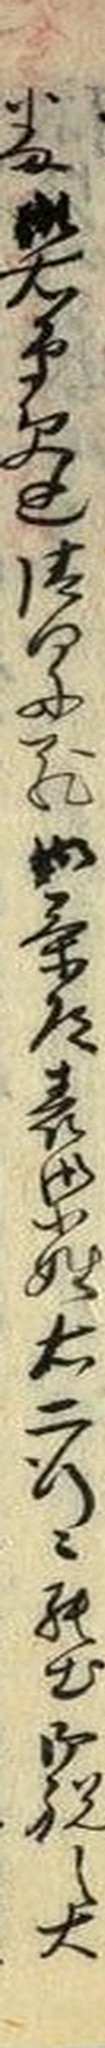番御右筆受込清田丹蔵御茶道表御小姓右二行ニ罷出御祝之大
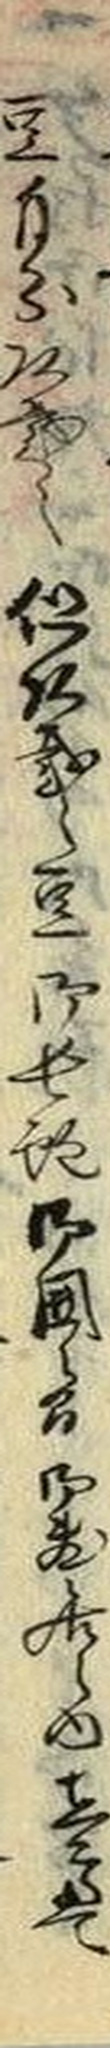豆自分頂戴之但頂戴之豆御長鮑御囲之間御敷居之内壱畳
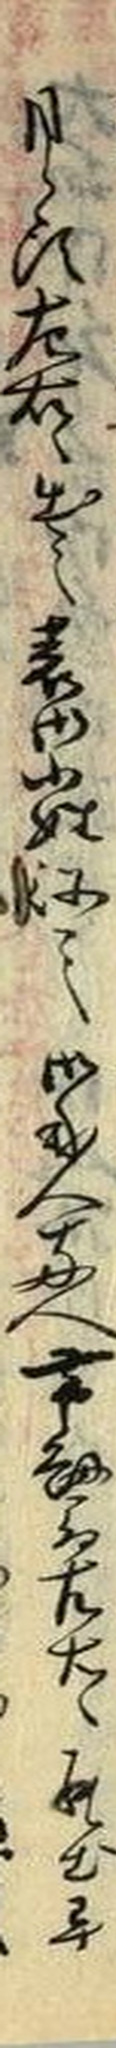目へ頭左右へ出之表御小姓役之御用人両人帯剣ニ而左右へ罷出畢
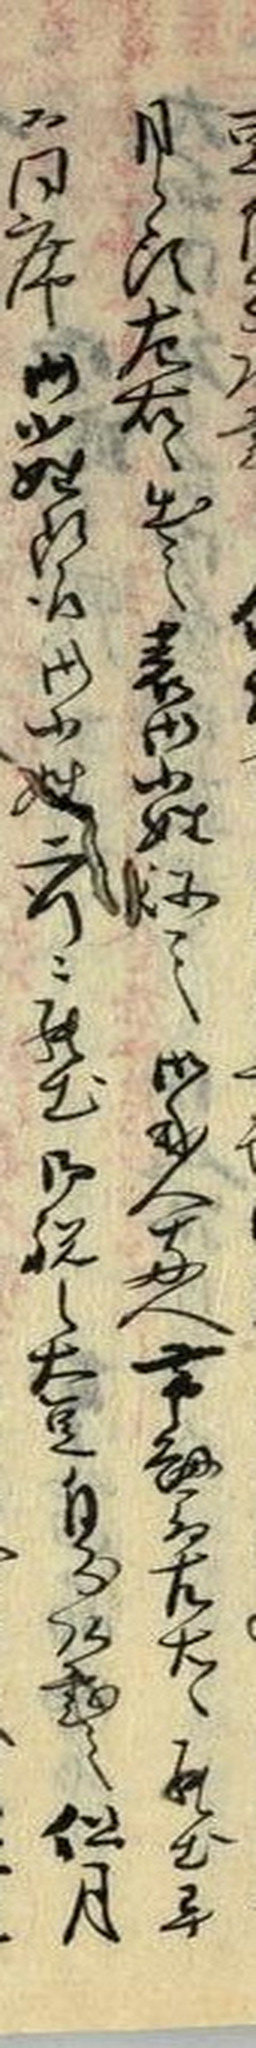而同席御小姓頭取御小姓二行ニ罷出御祝之大豆自分頂戴之但月
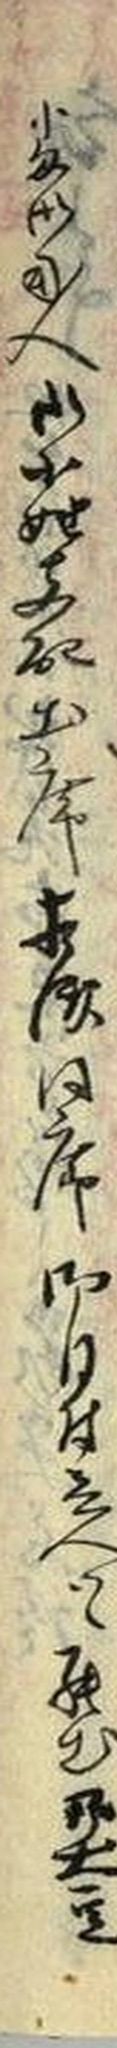番御用人御小姓支配出席相済同席御目付壱人ツヽ罷出御大豆
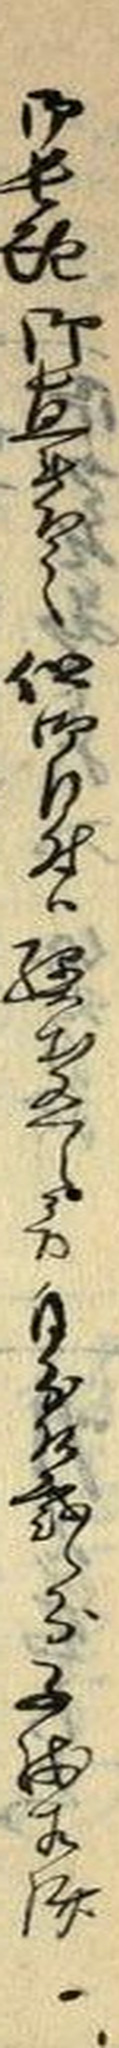御長鮑御直被下之但御目付ハ繰出有之ニ付自分頂戴之分不残相済
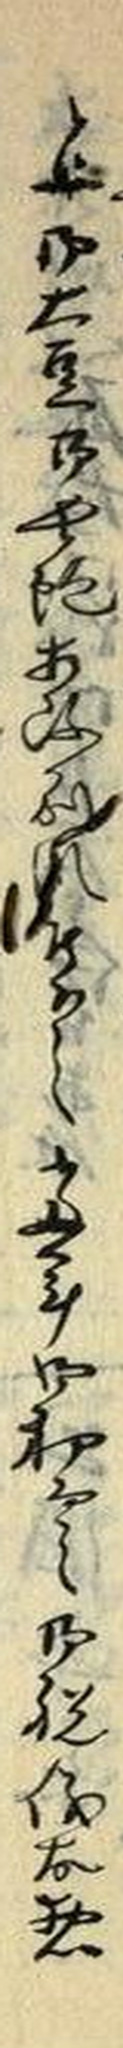之上御大豆御長鮑相改別段被下之当年御初而之御祝儀故惣
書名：少傅日録抄（斉承付側向頭取日記、在国）
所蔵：福井県文書館 Fukui Prefectural Archives
